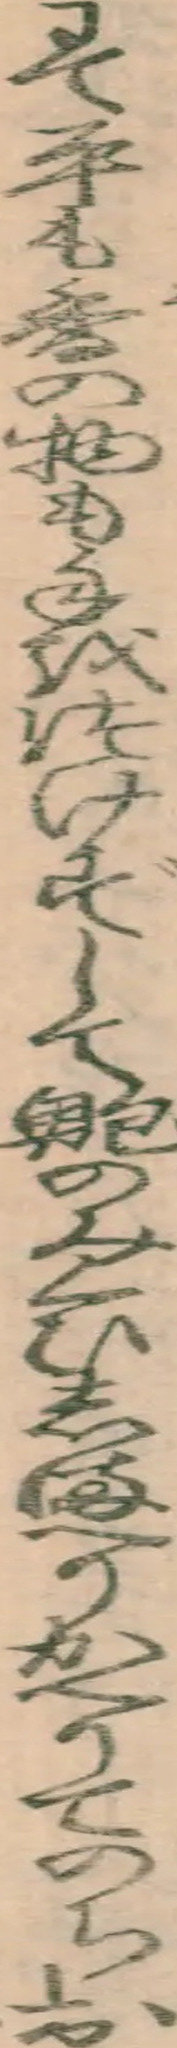にて平も香の物も手をつけずして鮑のみくひしまへりかへりてのちお
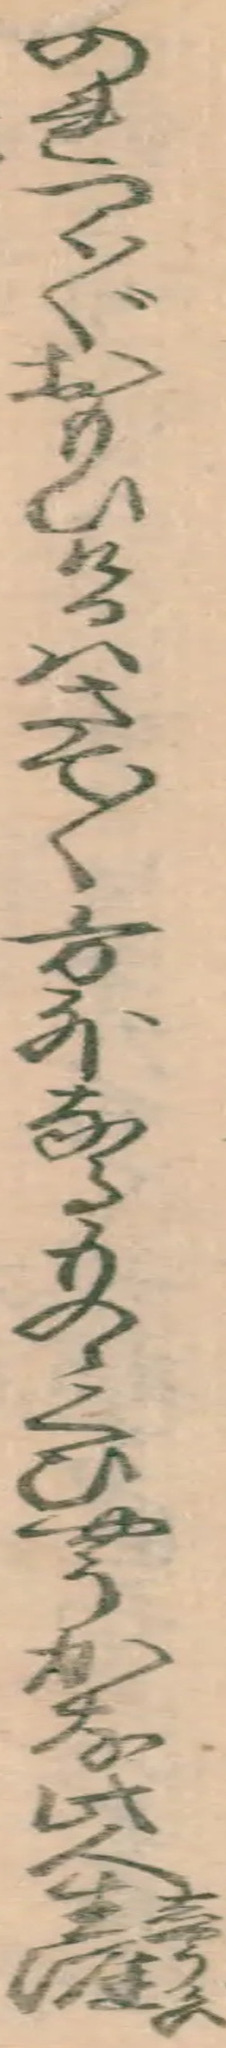のれつく〴〵おもひけるはさて〳〵方外なるものゝくひやうかな此人生涯
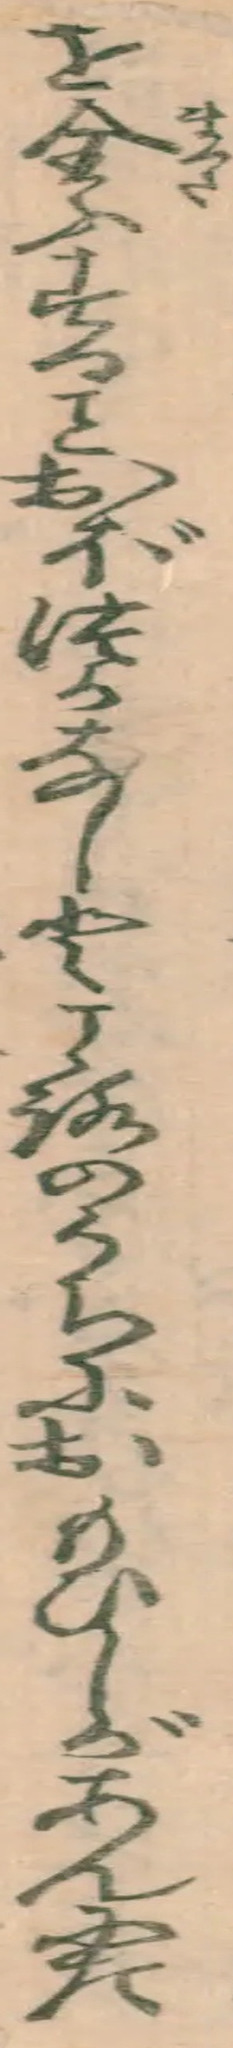を全ふすることおぼつかなしとこゝろのうちにおもひしがあんにた
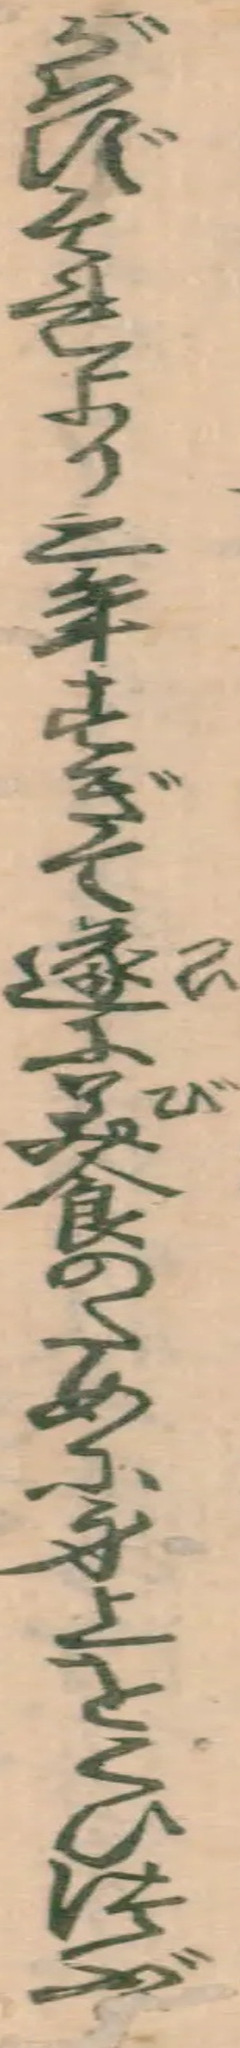がはずそれより二年すぎて遂に美食のために身上をくひつぶ
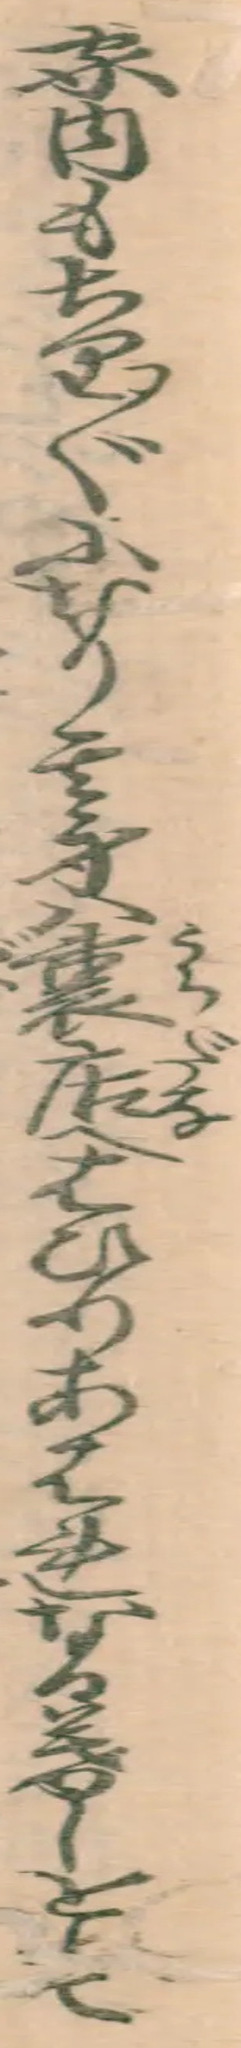家内もちり〴〵になり其身は裏店へはひりあはれなる暮しをして
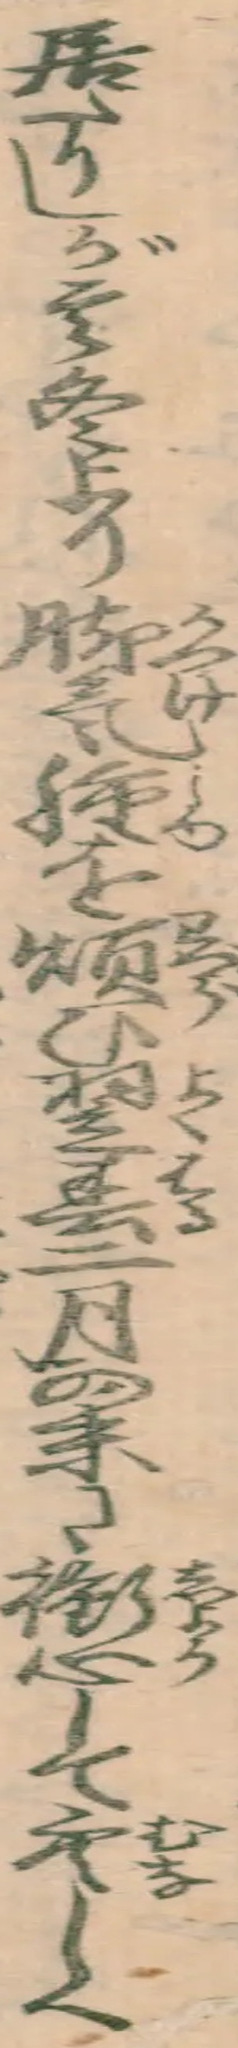居たりしが其冬より脚気種を煩ひ翌春二月の末に衝心して空しく
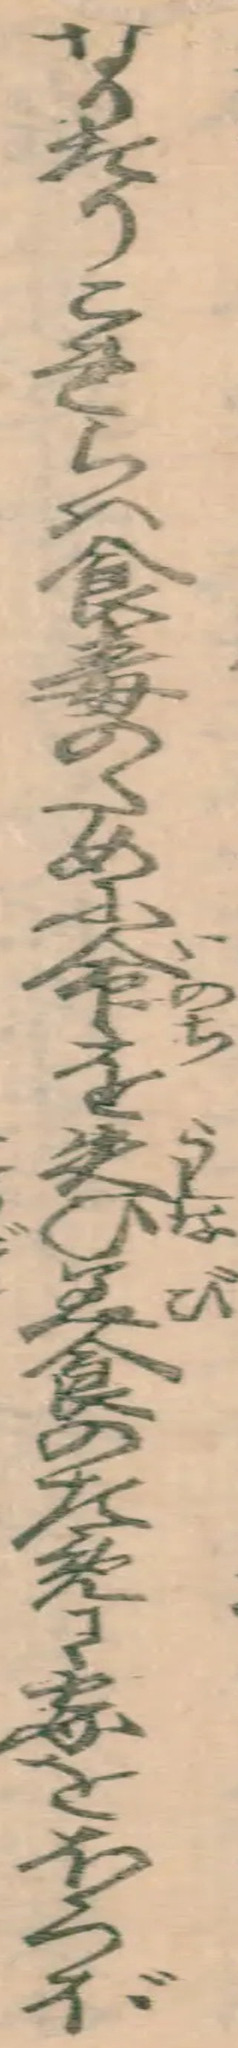なりたりこれらは食毒のために命を失ひ美食のために家をほろぼ
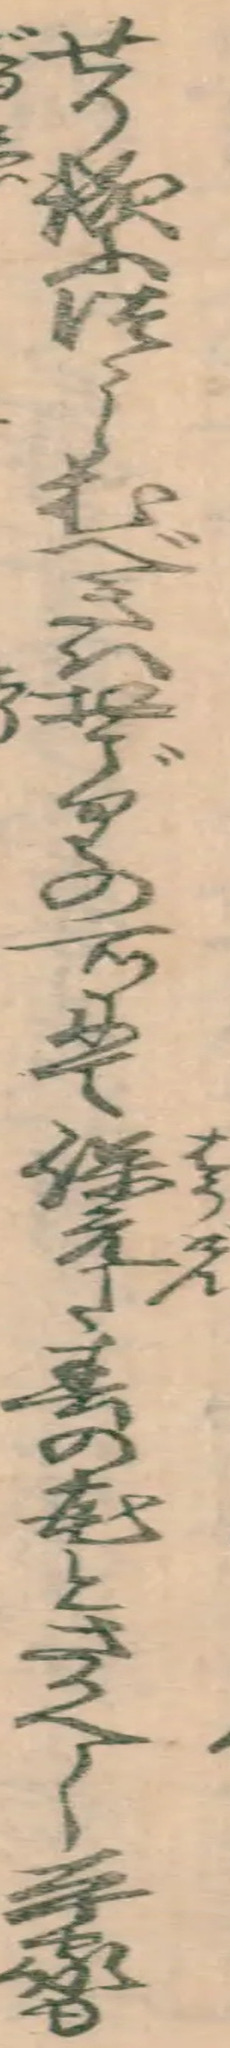せり頑につゝしむべきはおごりの所にて保元に春の花とさかへし平家も
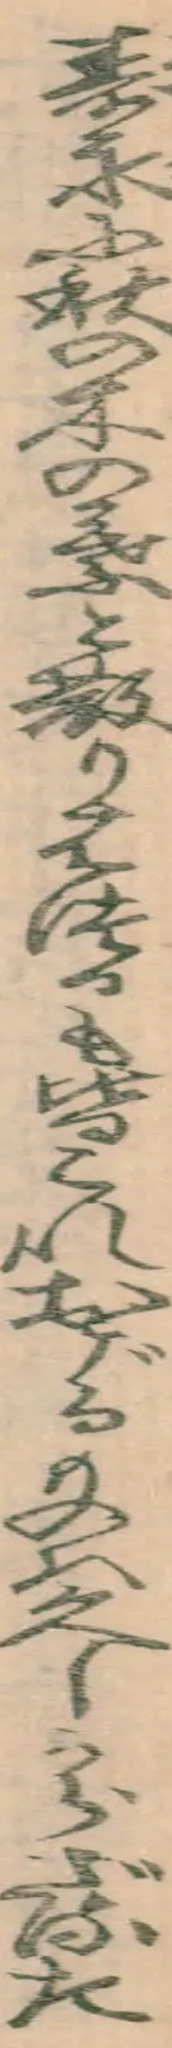寿永に秋の木の葉と散りはつるも皆これおごるものは久しからざるた
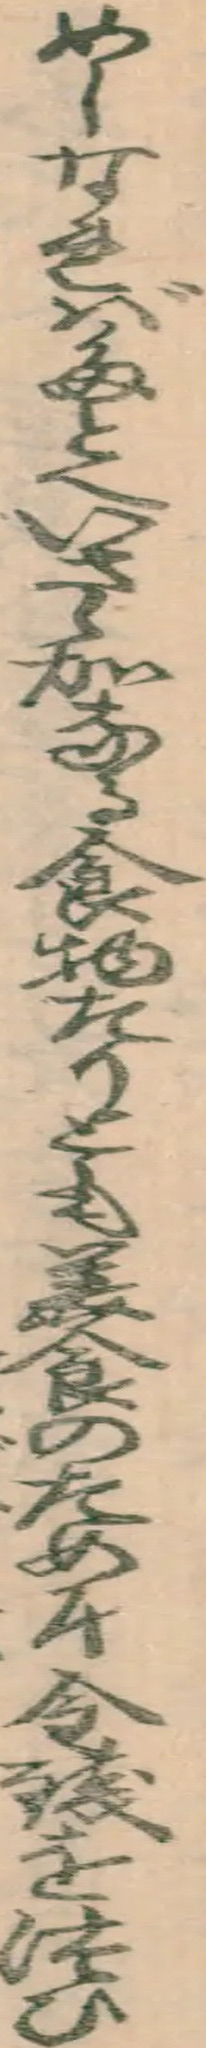めしなればたとへいさゝかなる食物たりとも美食のために金銭をつひ
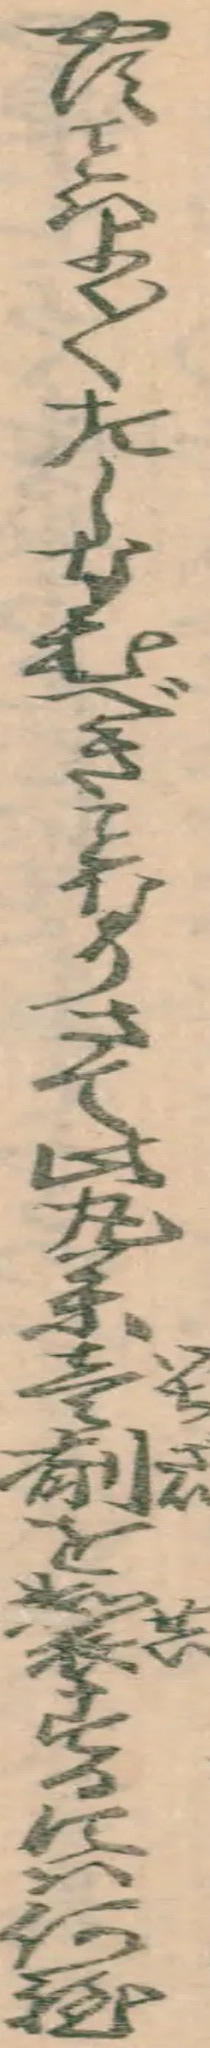やすことはよく〳〵たしなむべきことなりさて此丸薬壱剤を製するには何程
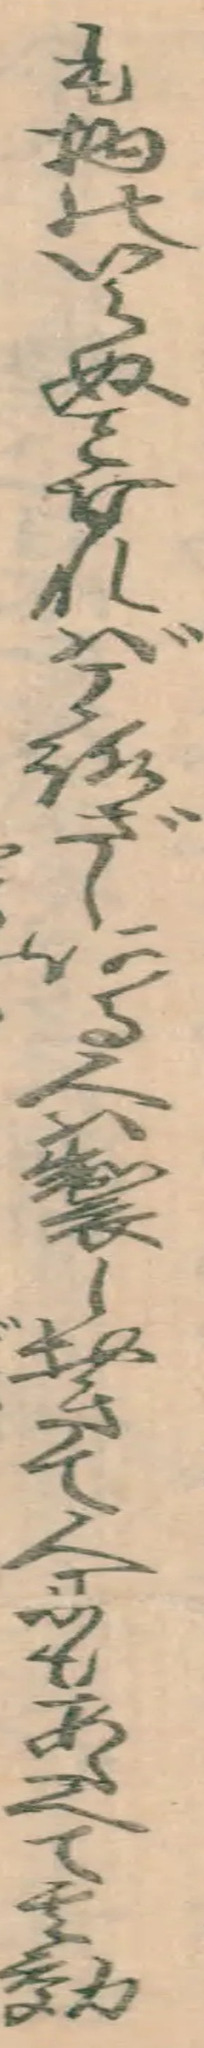も物のいらぬことなればこゝろざしある人は製しおきて人にもあたへて其効
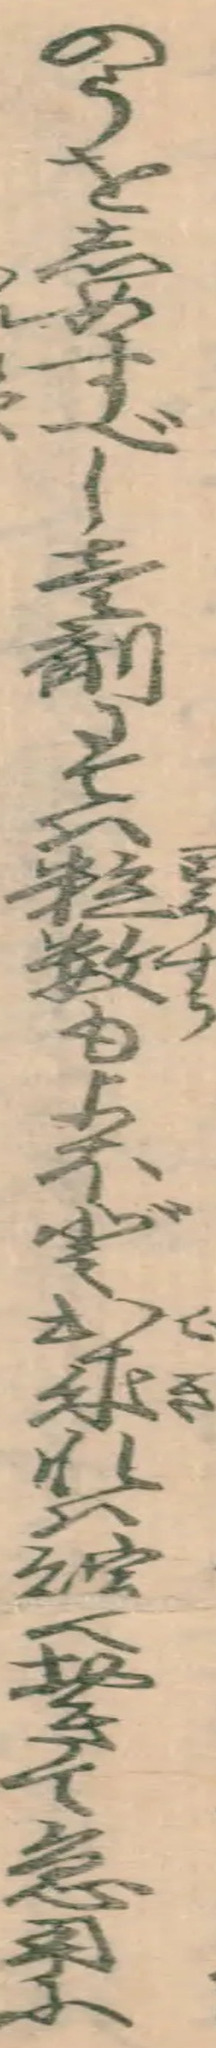のうをしめすべし壱剤にては粒数もよほど出来れは貯へおきて急用に
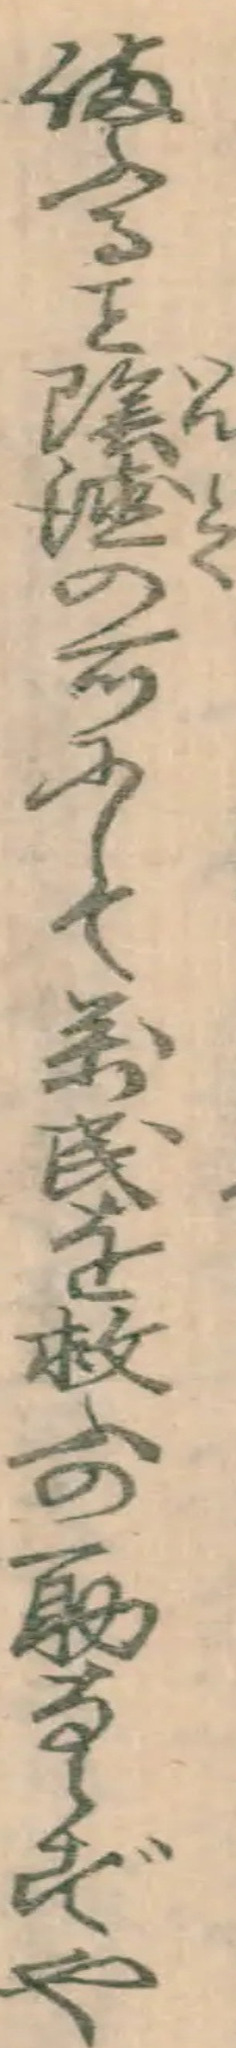備ふること陰徳の所にして万民を救ふの一助ならずや
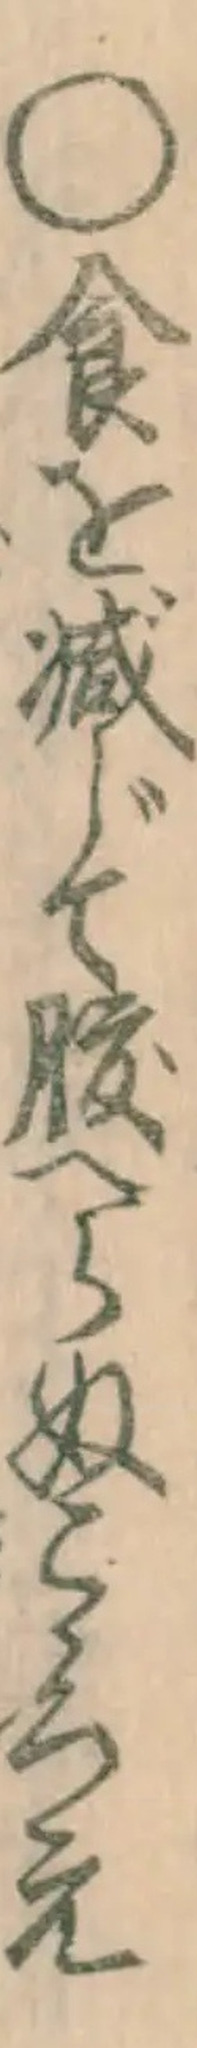○食を減じて腹へらぬこころえ
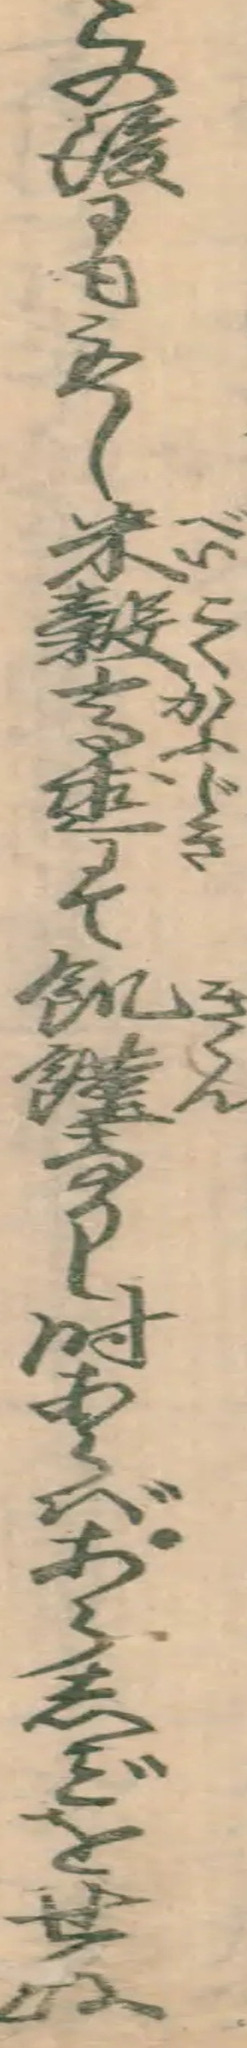この後にももし米穀高直にて飢饉なりし時あらば．あらしごとをせぬ
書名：日ごとの心得
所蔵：国立国会図書館 National Diet Library, JAPAN
